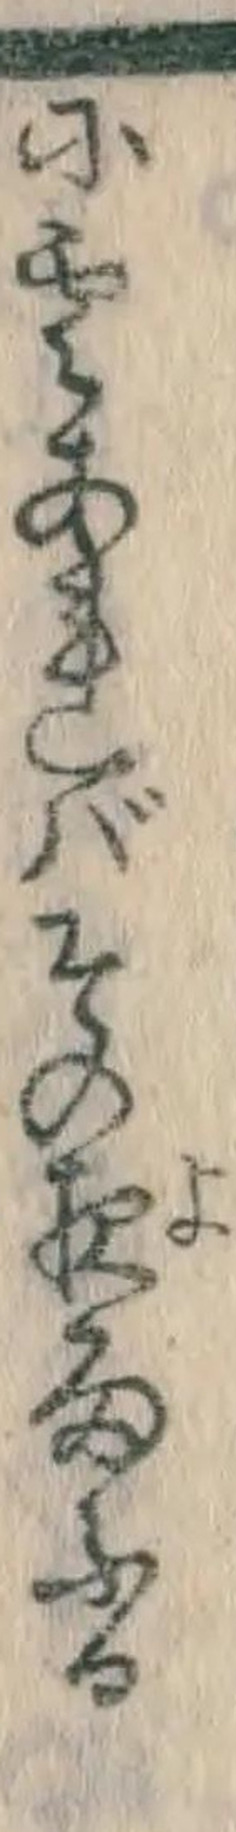に雲あればその夜雨ふる
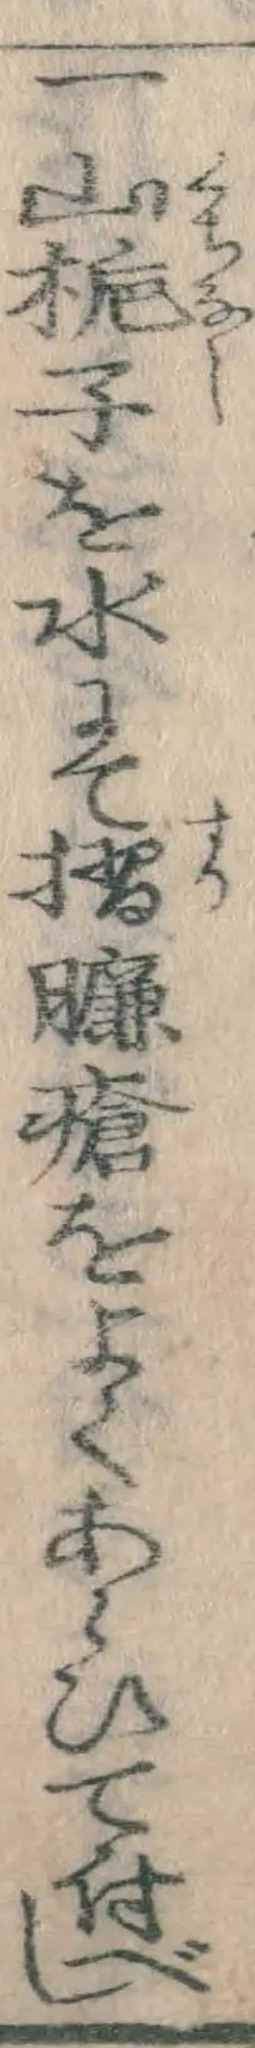一山梔子を水にて摺臁瘡をよくあらひて付べし

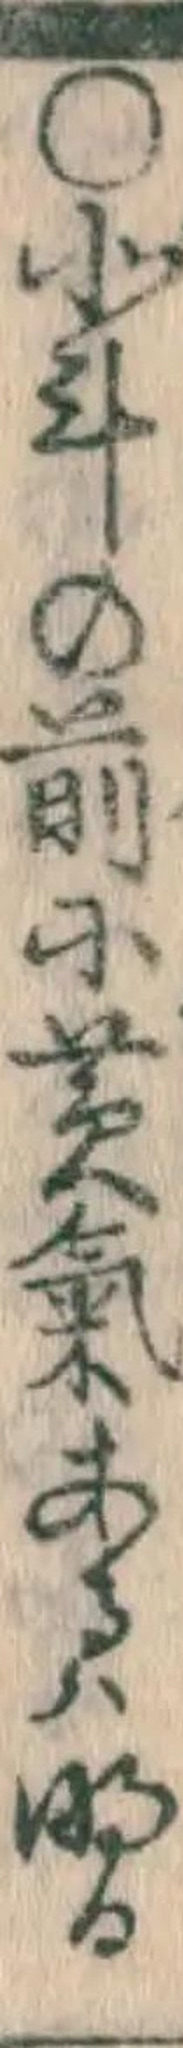○北斗の前に黄気あるは明日
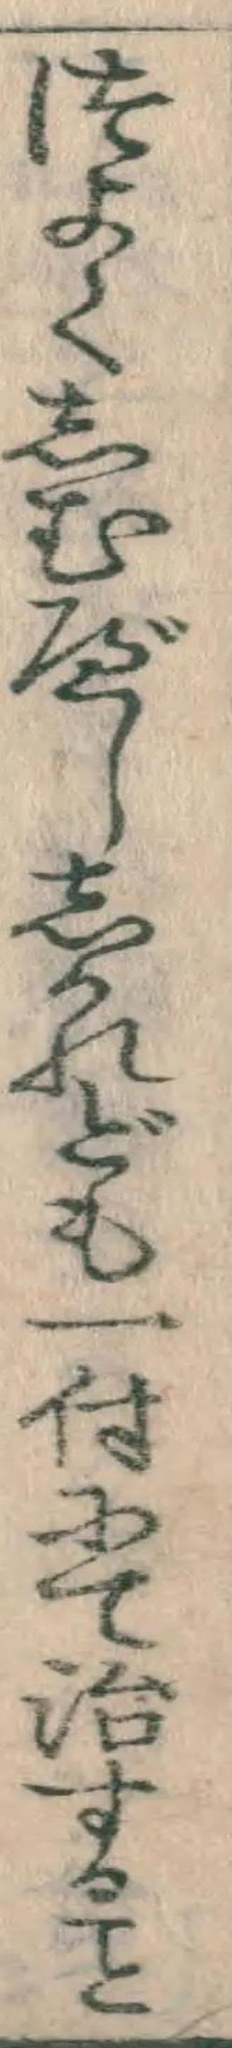つよくしむべししかれども一付にて治すること
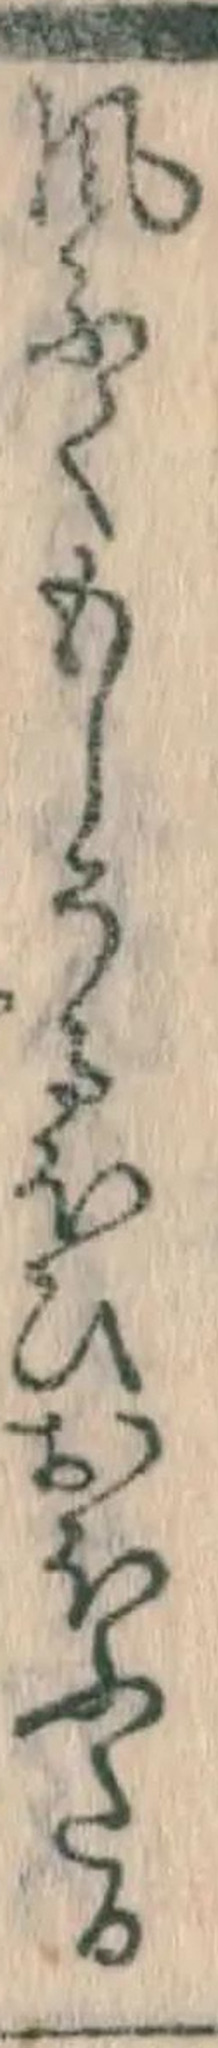風ふくもしうるほひおほふたる
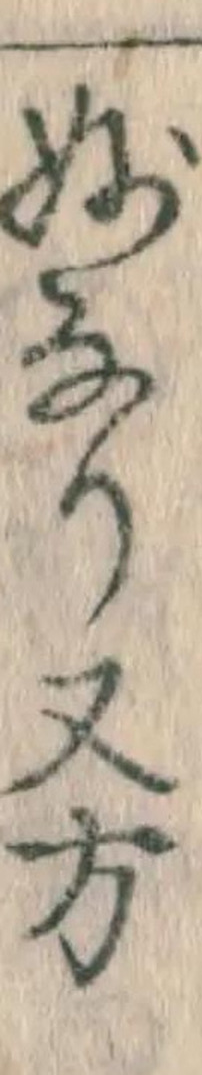妙なり又方
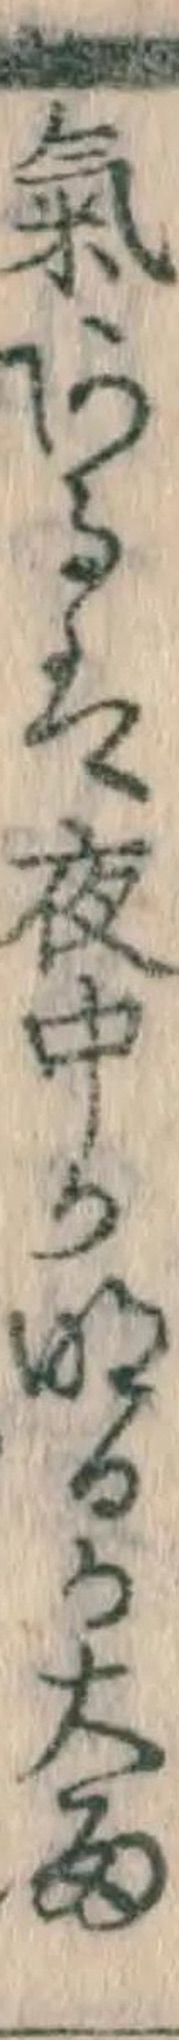気あるは夜中か明日か大雨
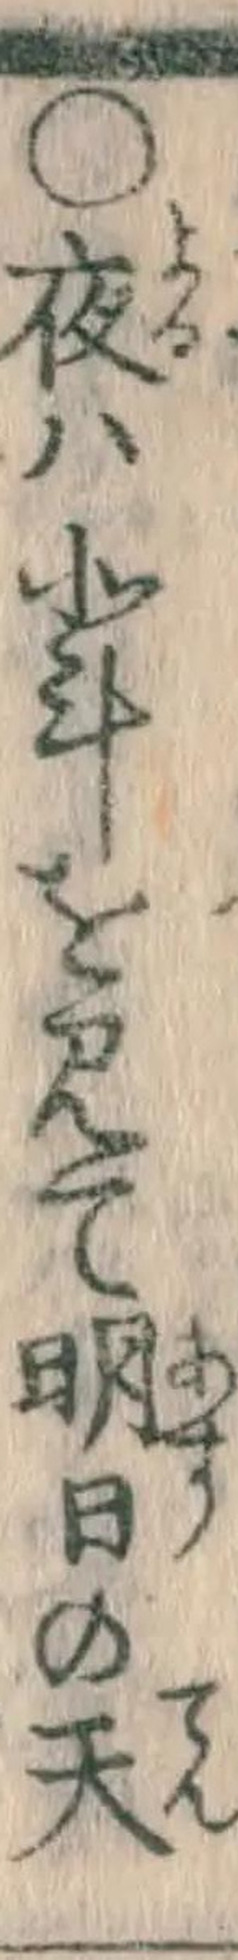○夜は北斗を見て明日の天
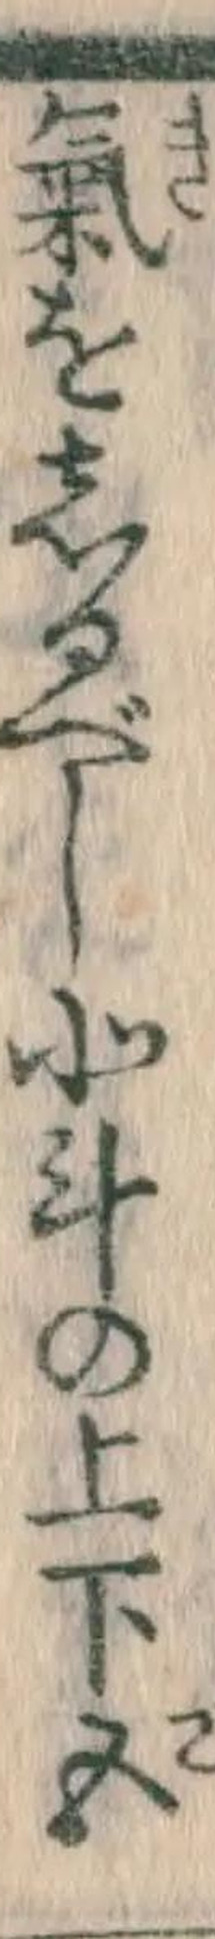気をしるべし北斗の上下五
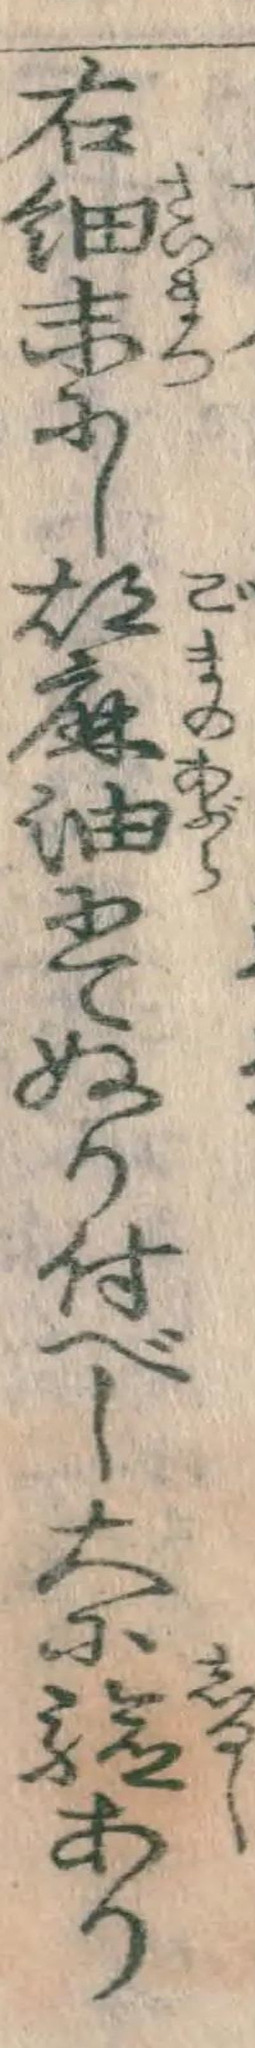右細末にし胡麻油にてぬり付べし大に験あり
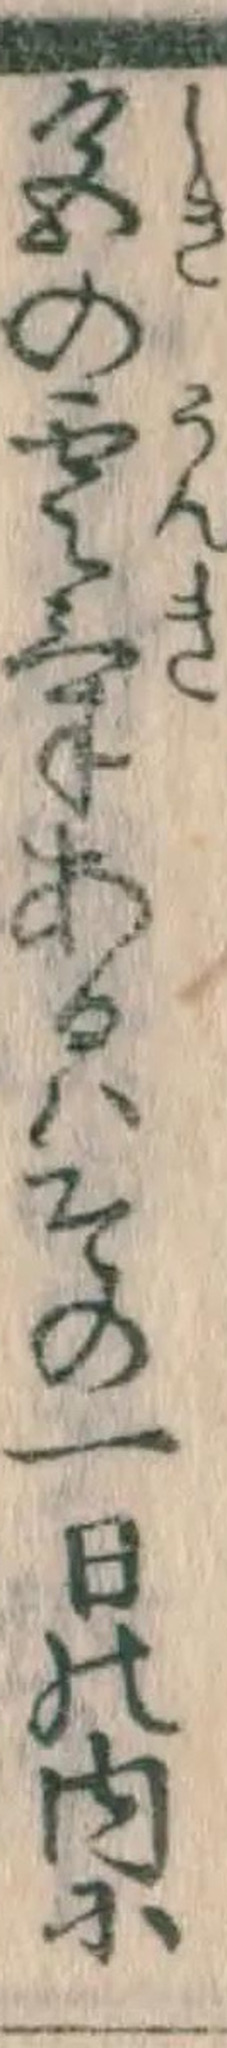色の雲気あるはその一日の内に
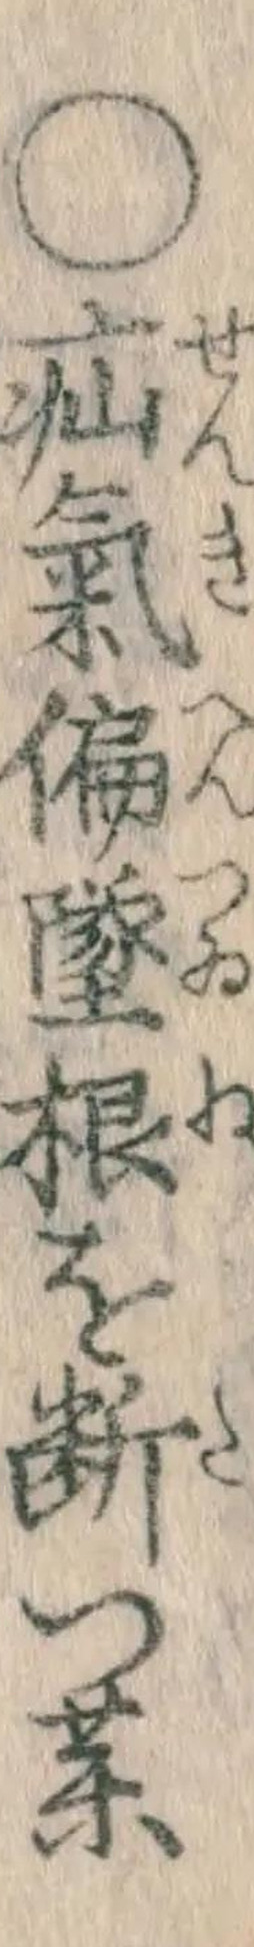○疝気偏墜根を断つ薬
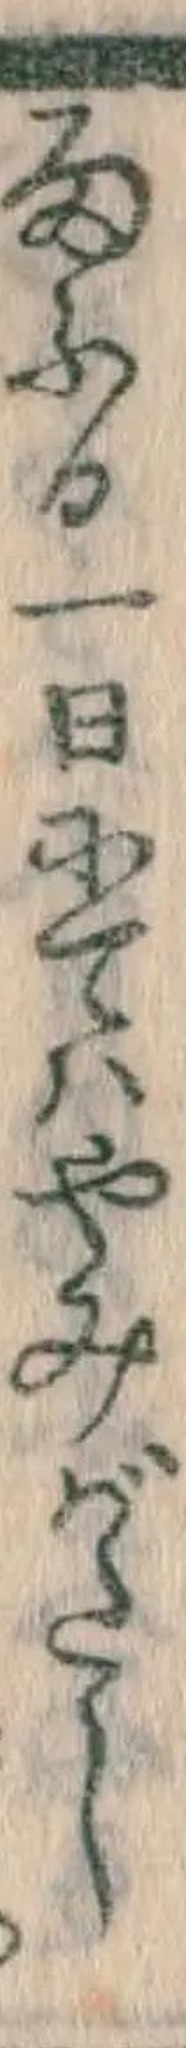雨ふる一日にてはやみがたし
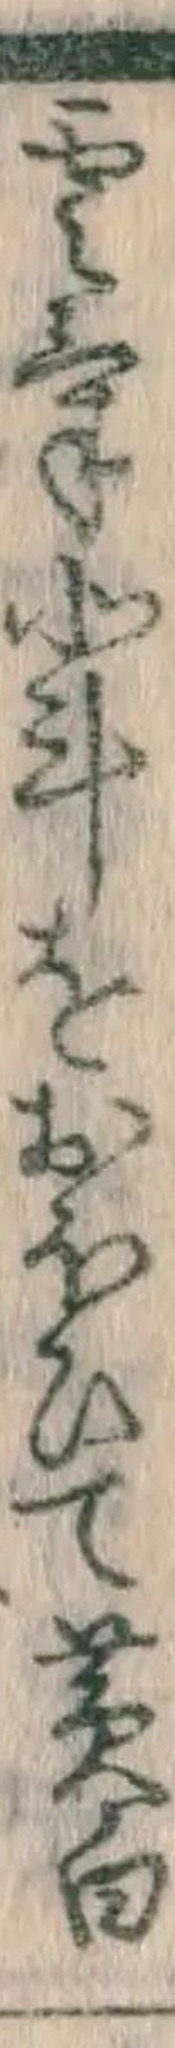雲気北斗をおほひて黄白
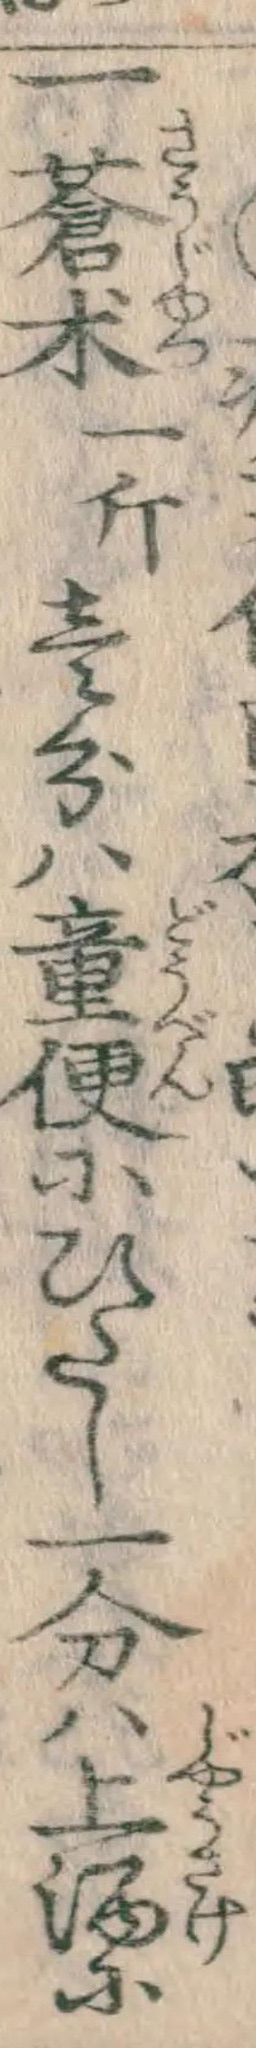一蒼朮一斤壱分は童便にひたし一分は上酒に
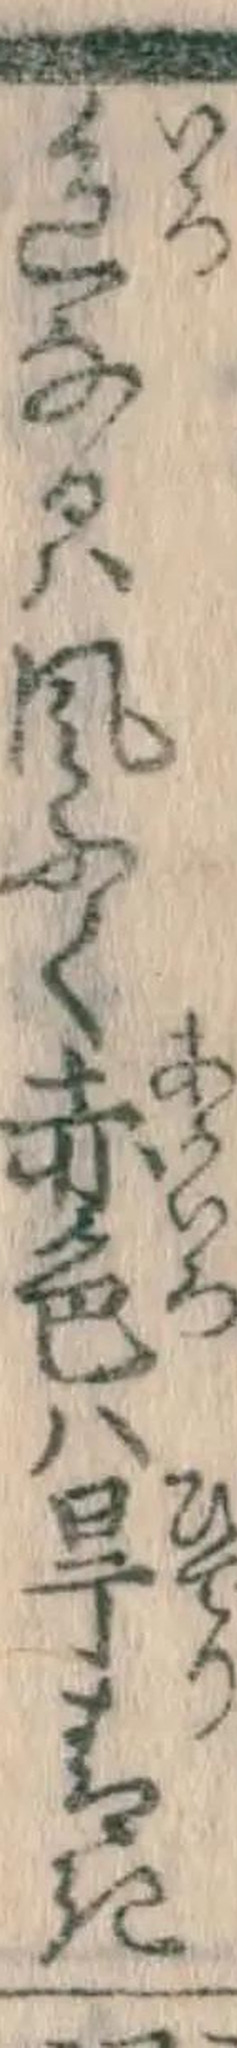色なるは風ふく赤色は旱青き
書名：広益秘事大全 3巻. [4]
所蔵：国立国会図書館 National Diet Library, JAPAN
